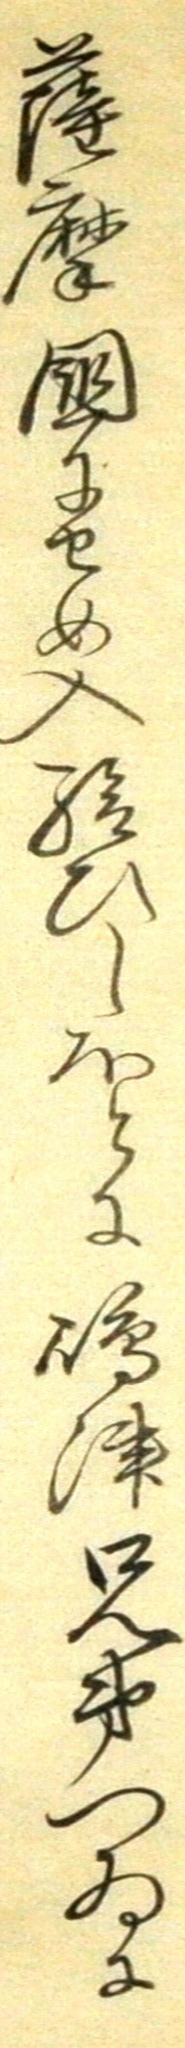薩摩国にせめ入給ひしほとに島津兄弟つゐに
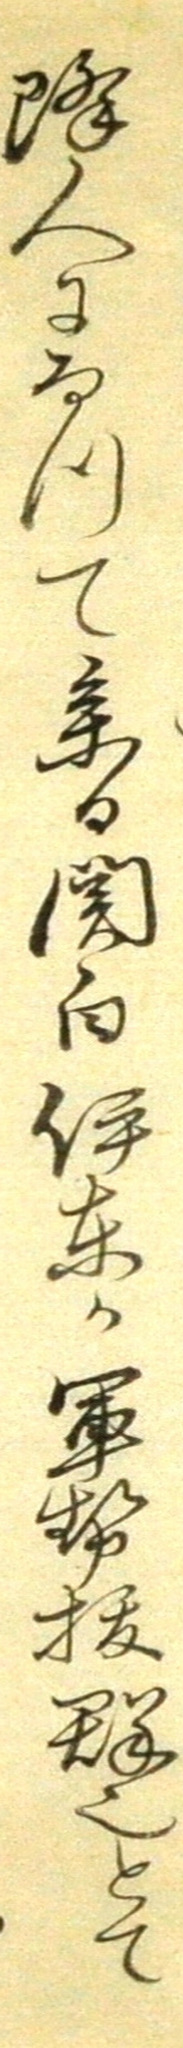降人になつて参る関白伊東か軍勢抜群也とて
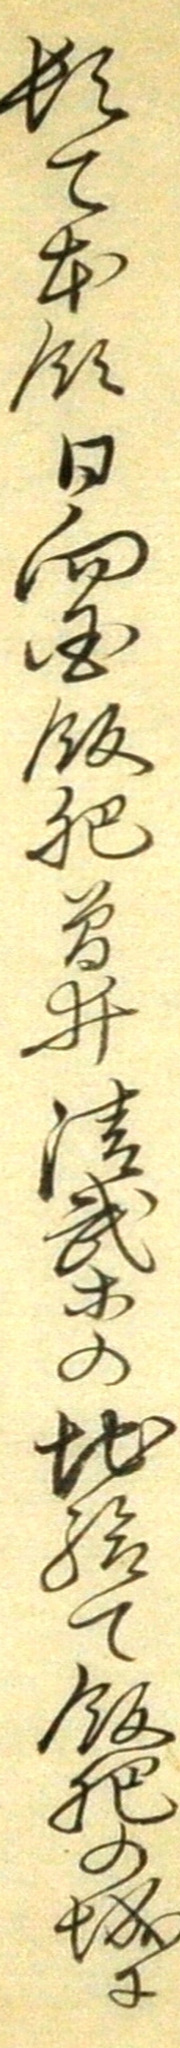頓て本領日向国飫肥曾井清武等の地給て飫肥の城に
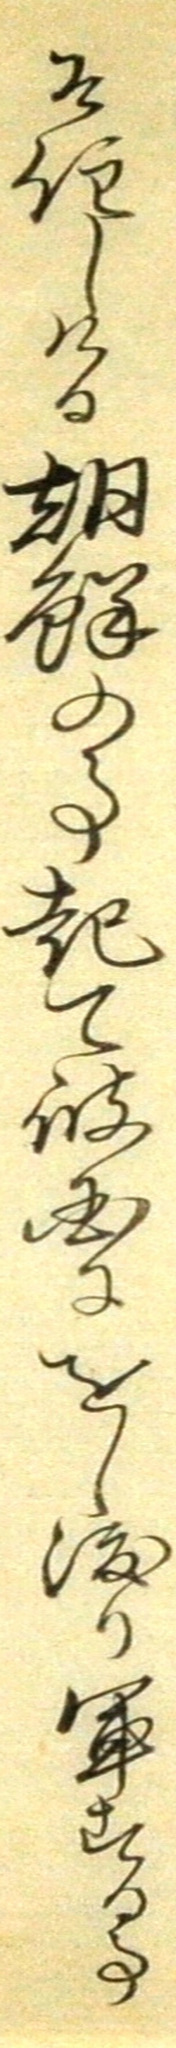そ住しける朝鮮の事起て彼国にをし渡り軍する事
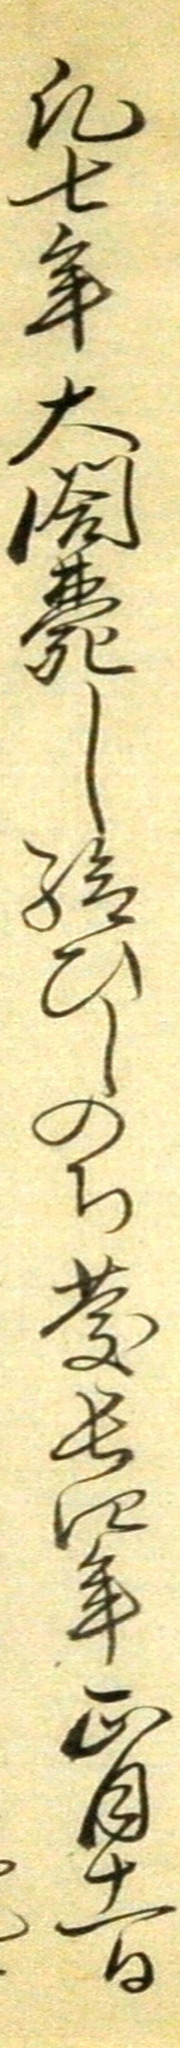凡七年太閤薨し給ひしのち慶長四年正月十一日
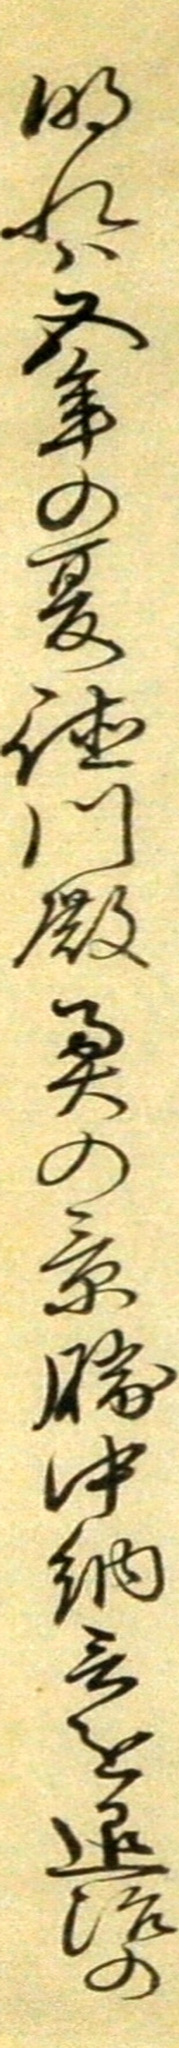明れは五年の夏徳川殿奥の景勝中納言を退治の
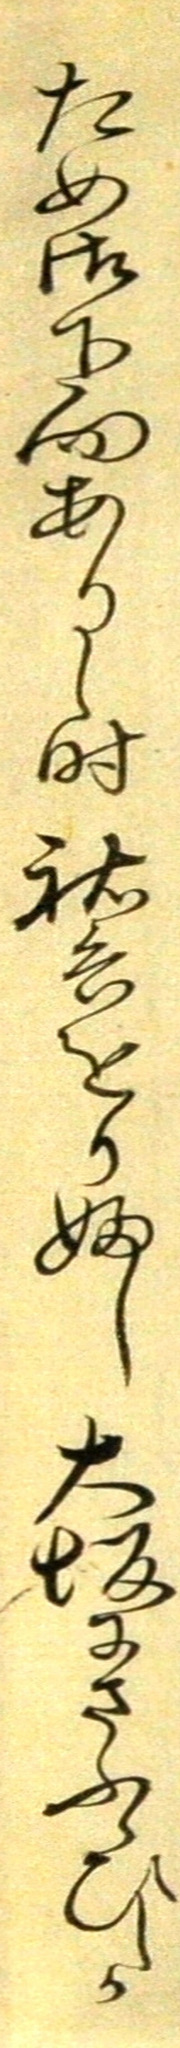ため御下向ありし時祐兵をりふし大坂にさふらひしか

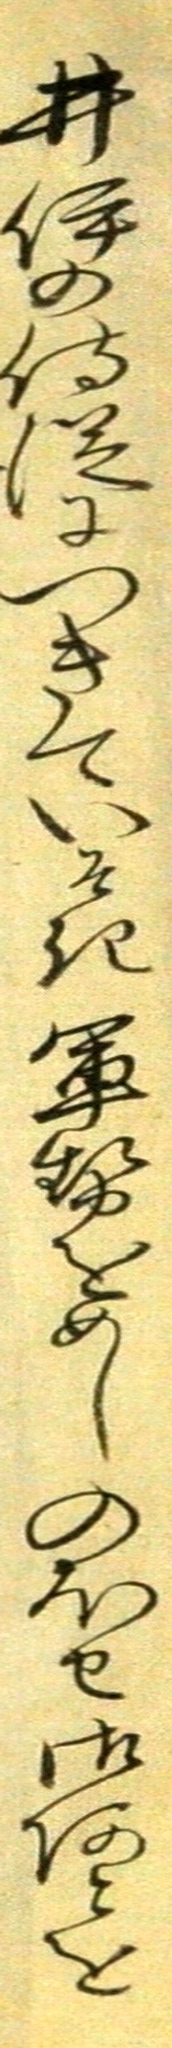井伊の侍従につきていそき軍勢をめしのほせ御あとを
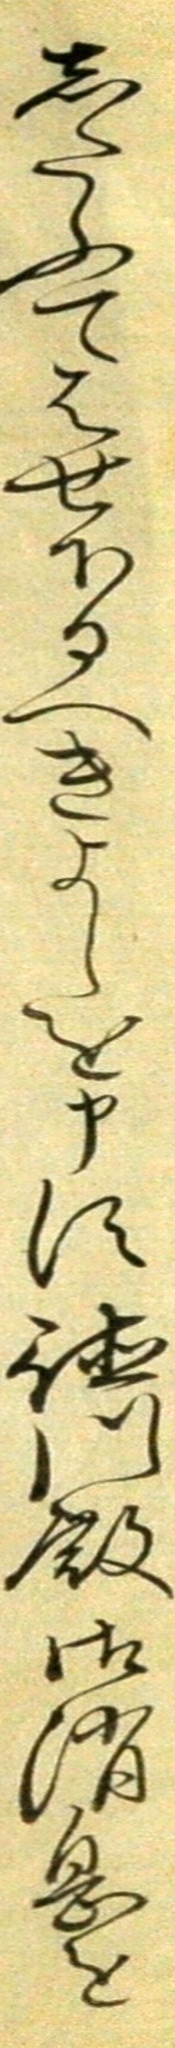したふてはせ下るへきよしを申す徳川殿御消息を
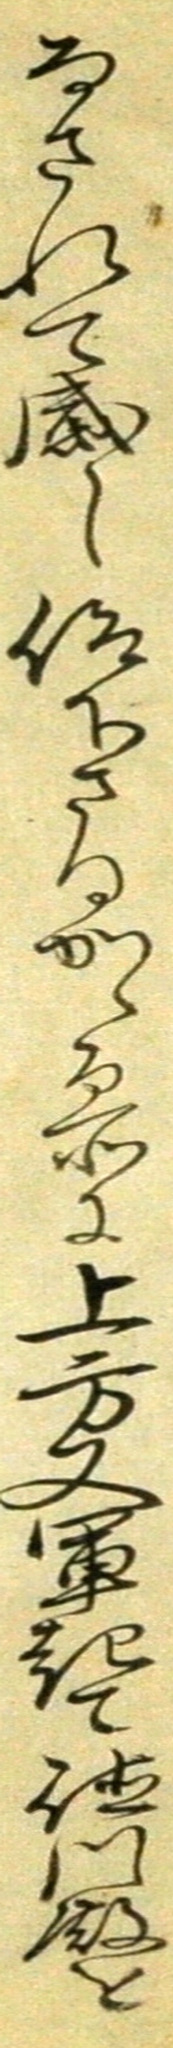なされて感し仰下さるかゝる所に上方又軍起て徳川殿を
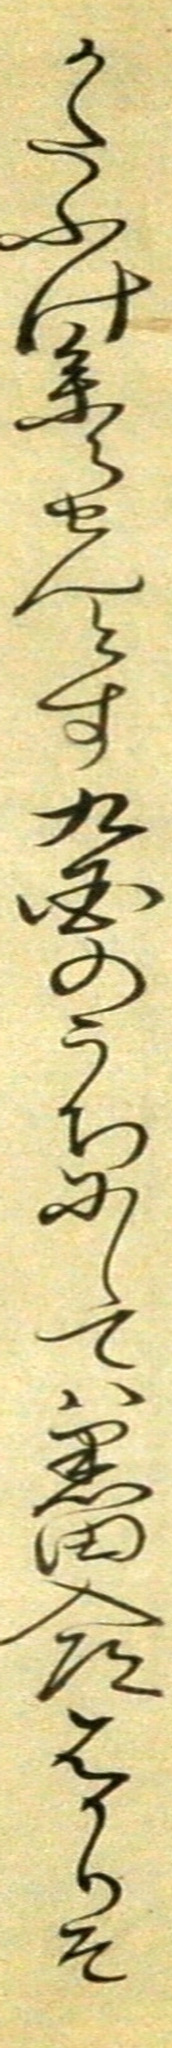かたふけ参らせんとす九国のうちにしては黒田入道はかりそ
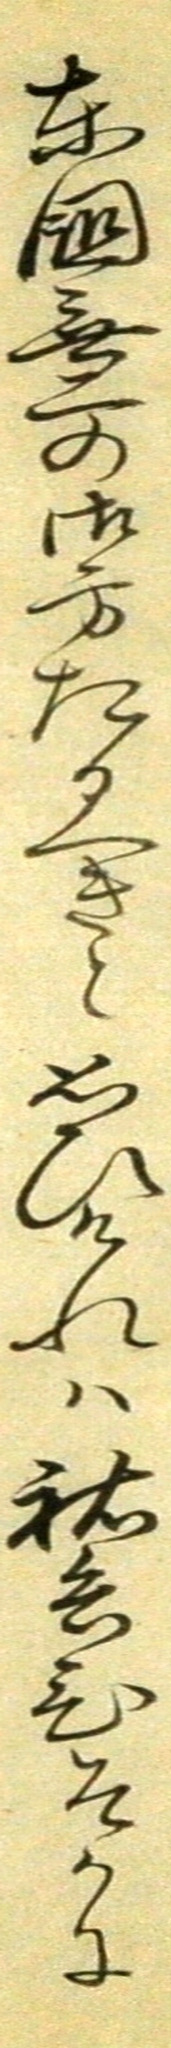東国無二の御方たるへきと思ひけれは祐兵ひそかに
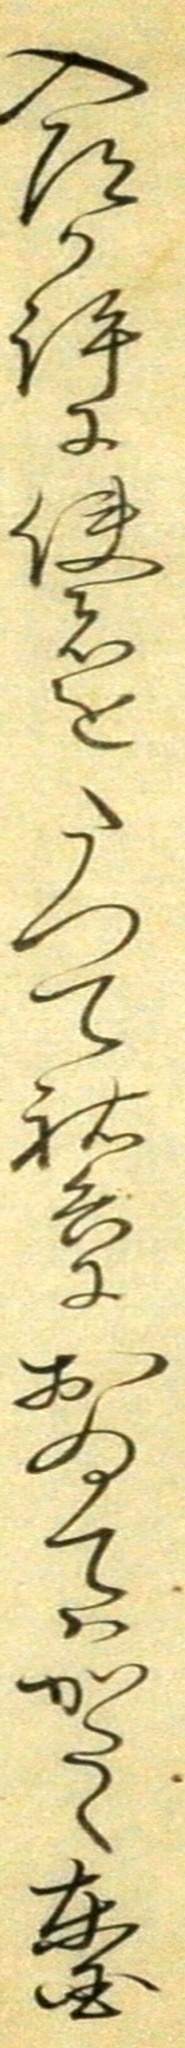入道か許に使者をたつて祐兵におゐてはかたく東国
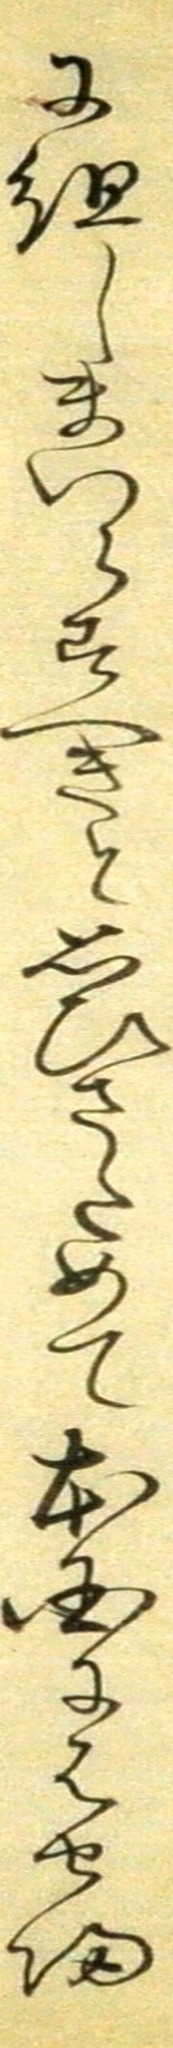に組しまいらすへきと思ひさためて本国にはせ帰
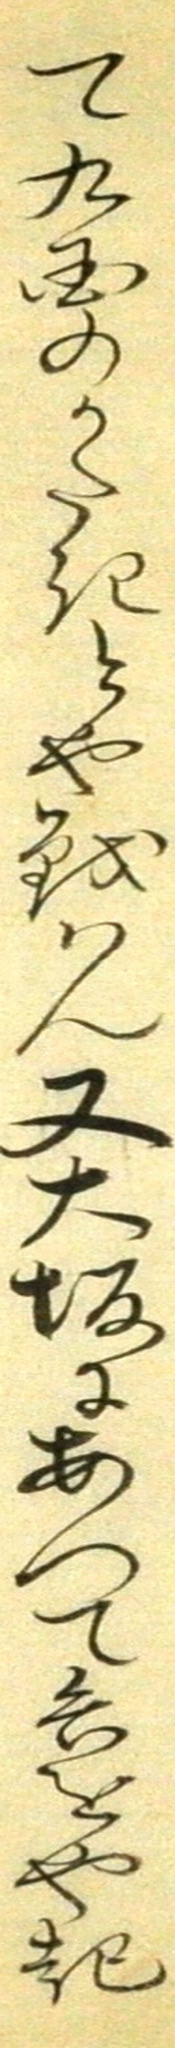て九国のかたきとや戦はん又大坂にあつて兵をや起
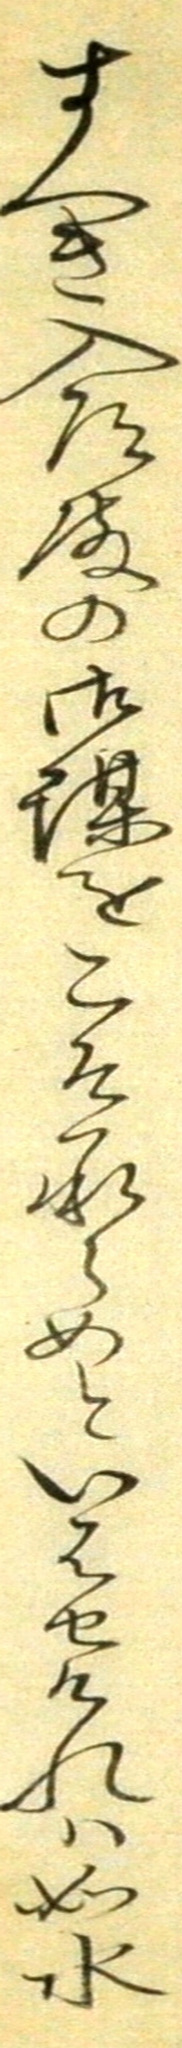すへき入道殿の御謀をこそ承らめといはせけれは如水
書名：藩翰譜（九・下）
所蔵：伊那市立高遠町図書館・合同会社AMANE
